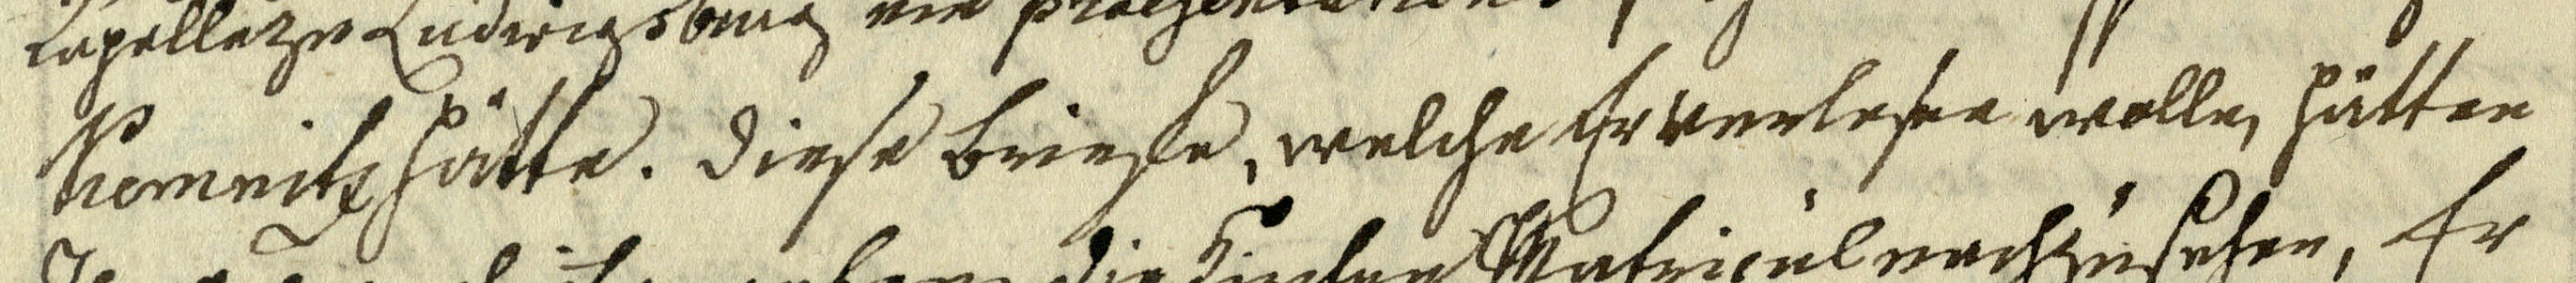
Kemnitz hätte. Diese Briefe, welche Er verlesen wolle, hätten
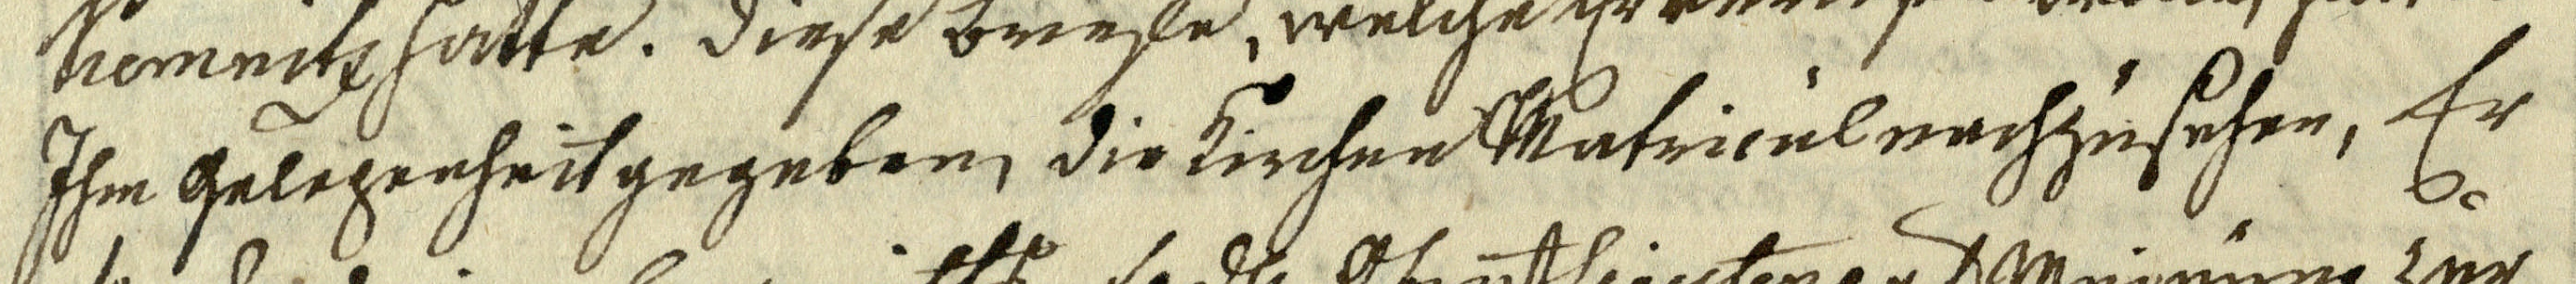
Ihm Gelegenheit gegeben, die Krichen Matricul nachzusehen, Er
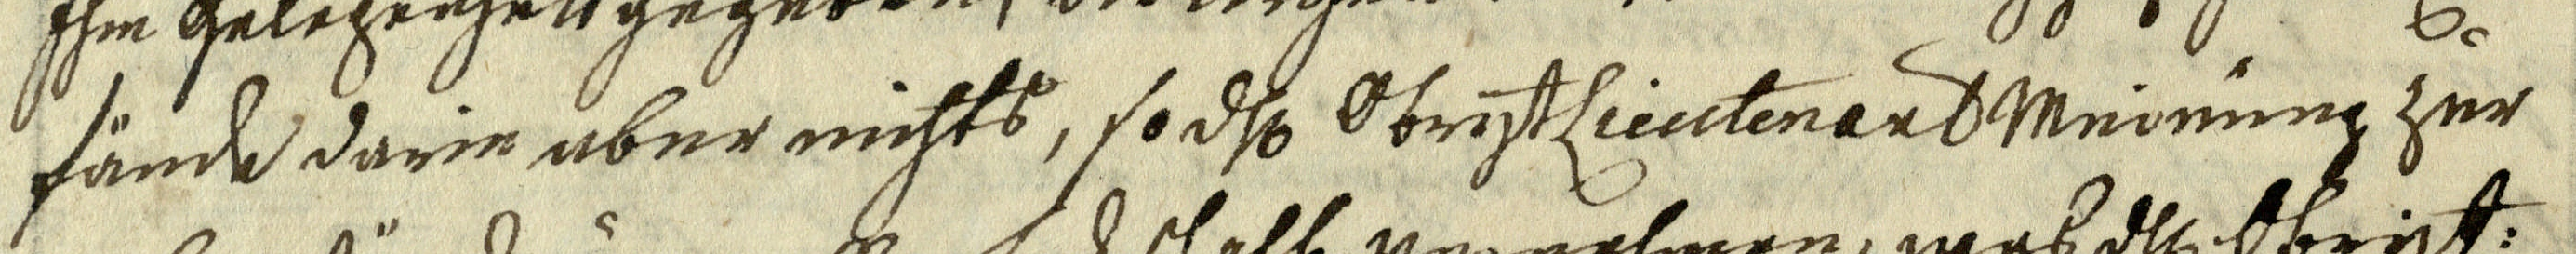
fände darin aber nichts, so dH ObrtistLieutenant Meinung zur
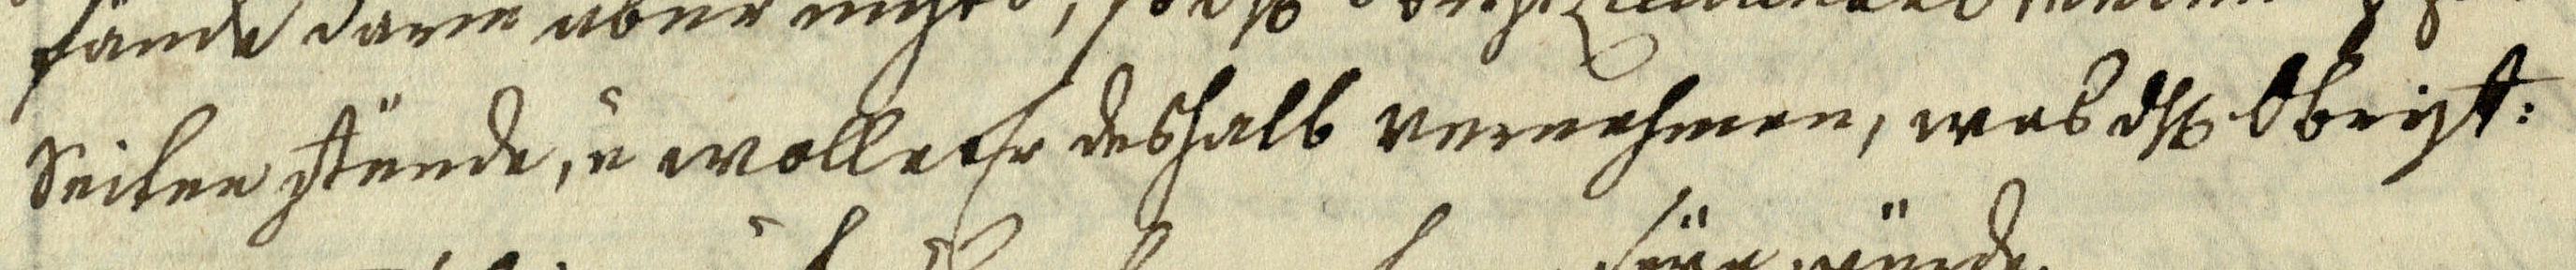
Seiten stünde, u wolle er deshalb vernehmen, was dH Obrist¬
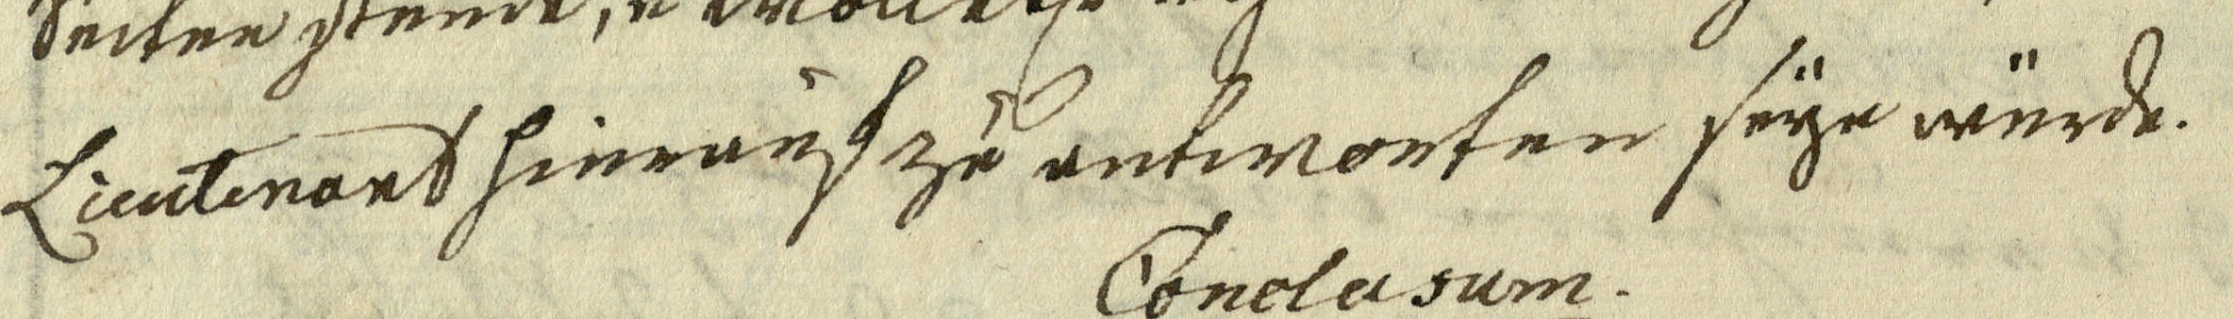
Lieutenant hierauf zu antworten seÿn würde.
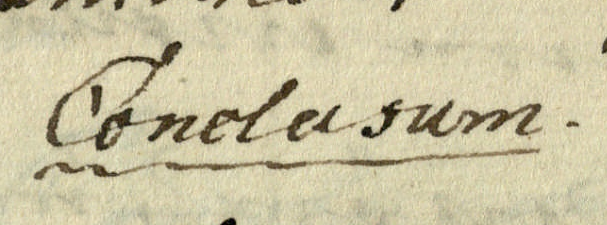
Conclumsum.
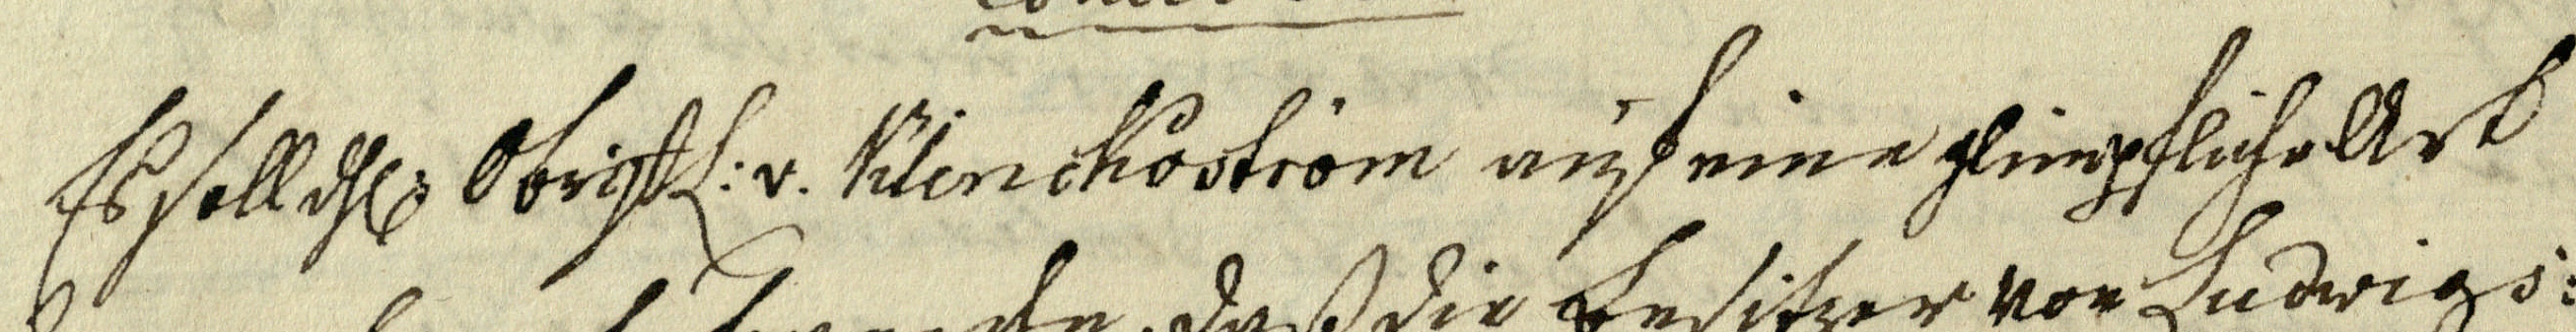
Es soll dH Obrist L: v. Klinckoström auf eine glimpfliche Art
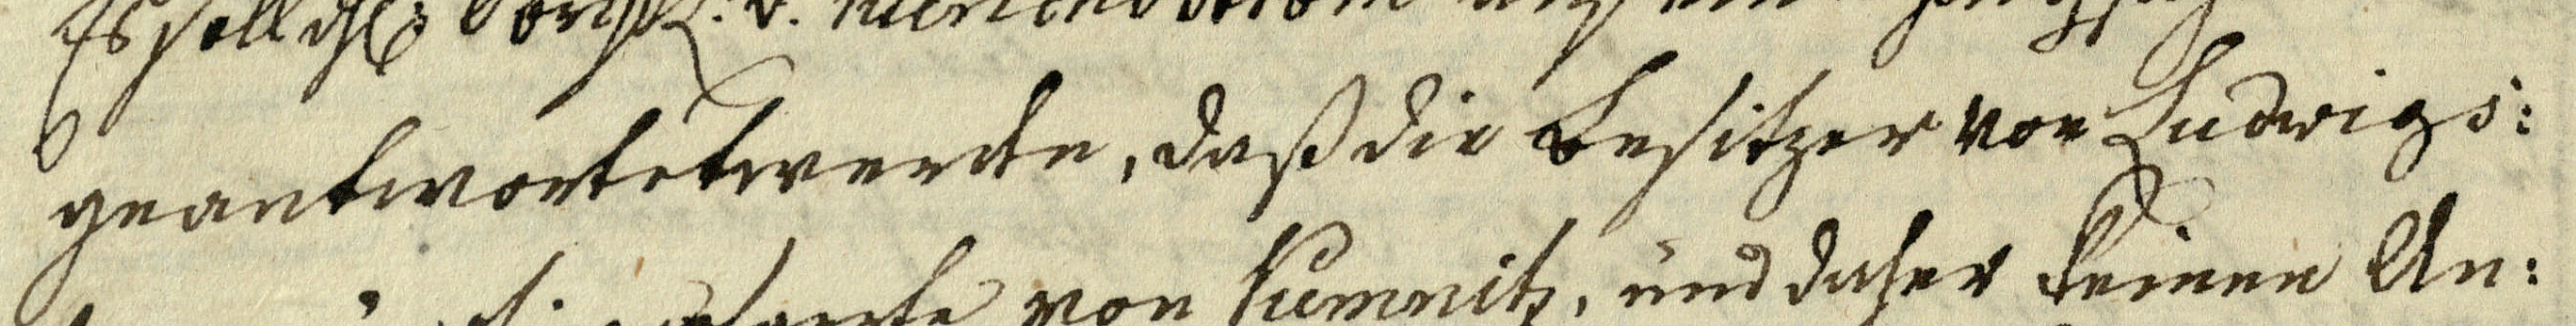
geantwortet werden, daß die Besitzer von Ludwigs¬
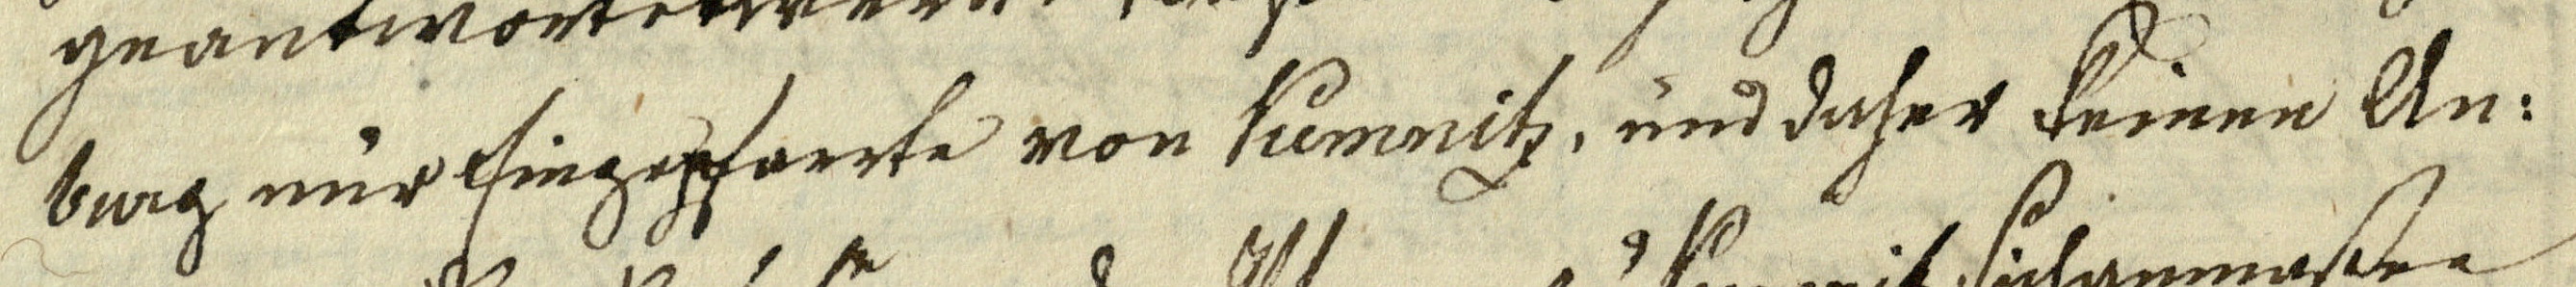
burg nur Eingepfarrte von Kemnitz, und daher keinen An¬
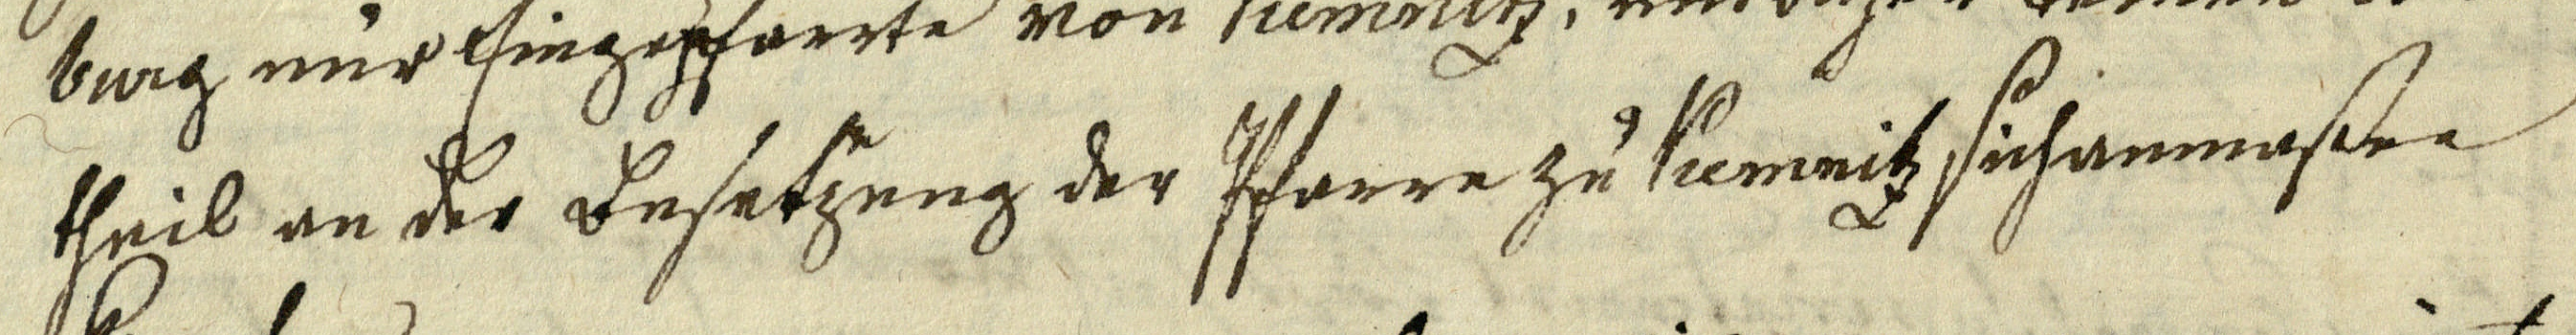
theil an der Besetzung der Pfarre zu kemnitz sich anmaßen
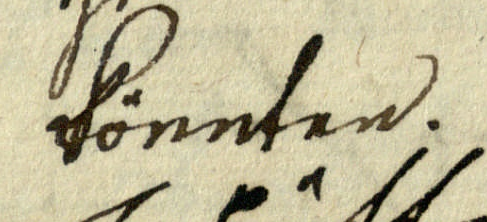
könnten.
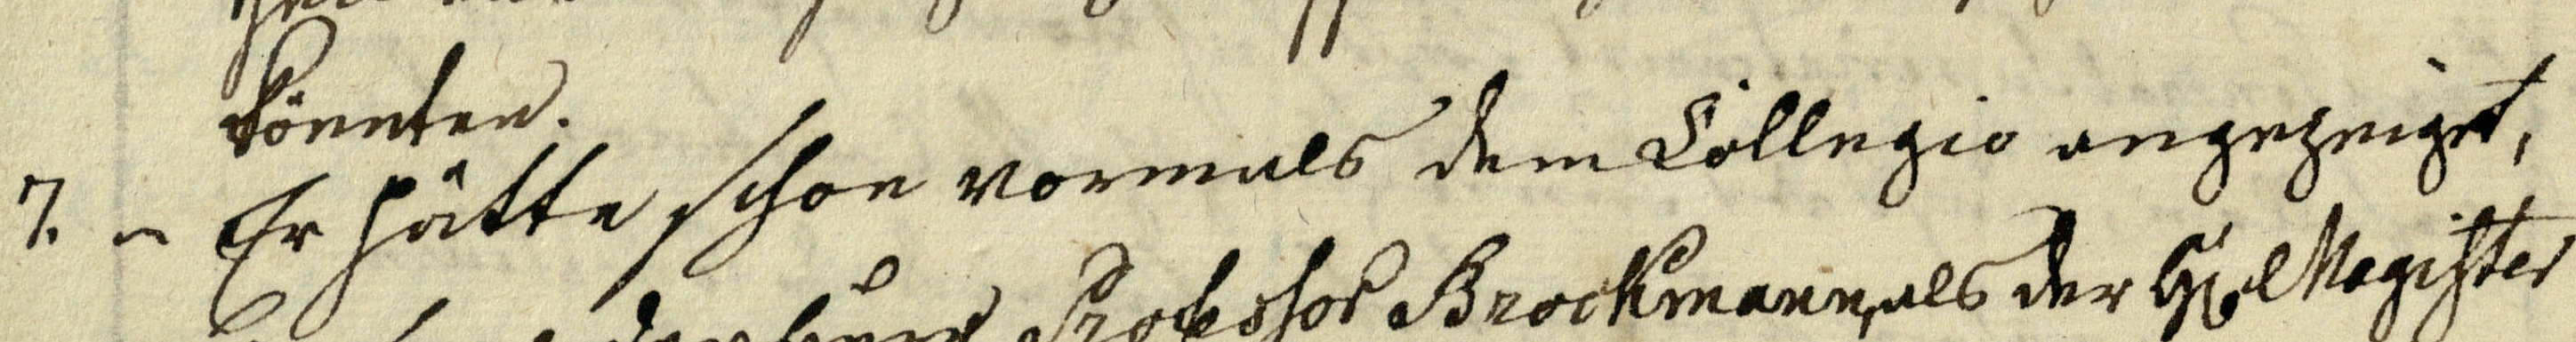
7. - Er hätte schon vormals dem Collegio angezeiget,
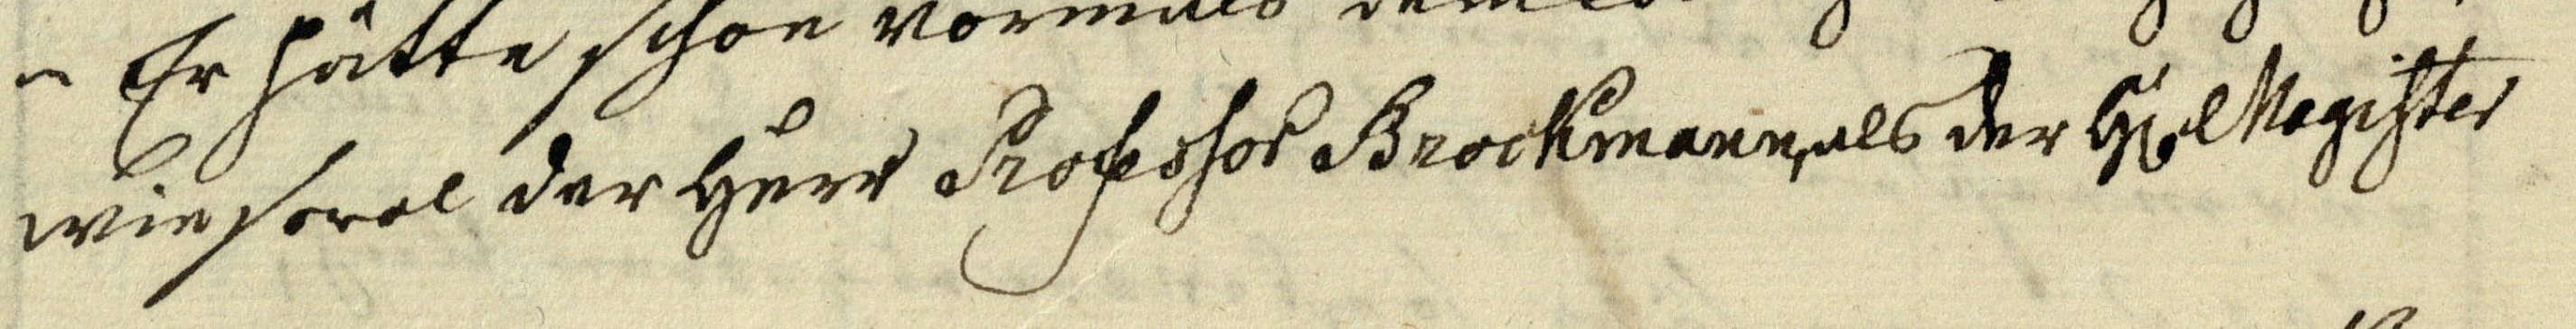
wie sowol der Herr Professor Brockmann, als der H Magister
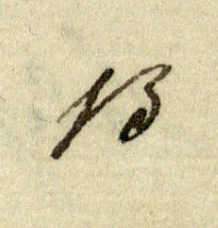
B
